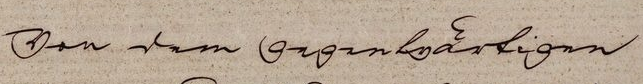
Von dem gegenwärtigen
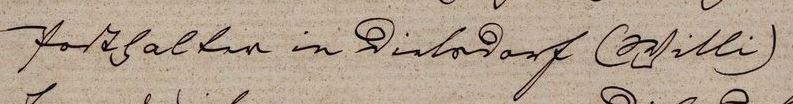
Posthalter in Dielsdorf (Willi)
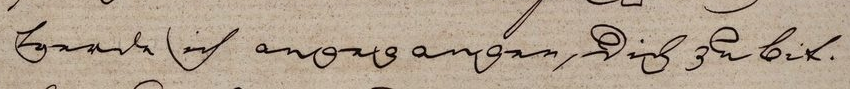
werde ich angegangen, Dich zu bit-
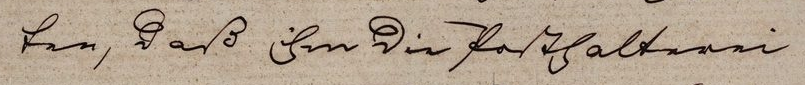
ten, daß ihm die Posthalterei
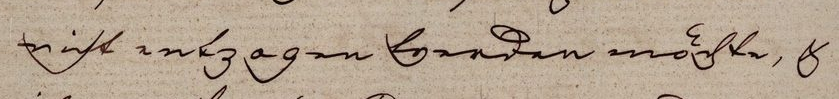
nicht entzogen werden möchte, &
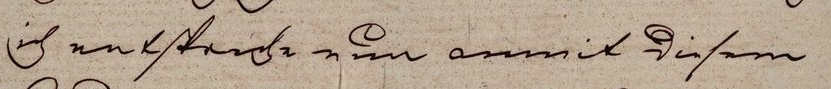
ich entspreche nun anmit diesem
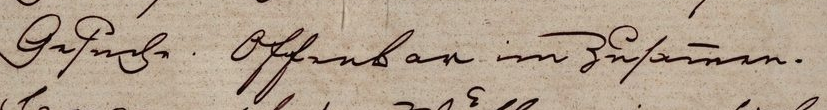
Gesuche. Offenbar im Zusammen-
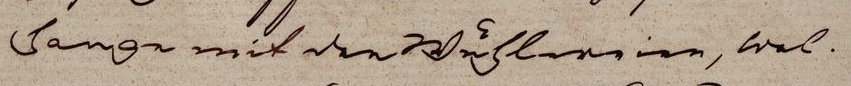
hange mit den Wühlereien, wel-
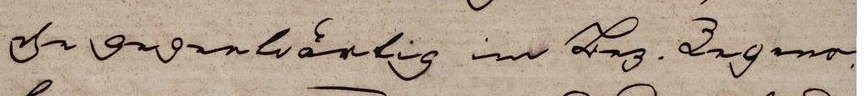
che gegenwärtig im Bez. Regens-
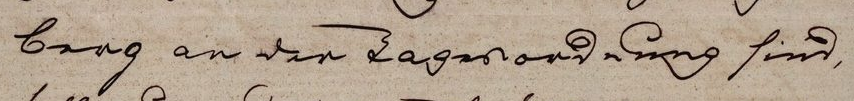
berg an der Tagesordnung sind,
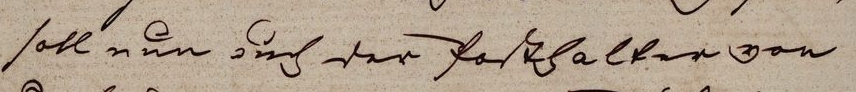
soll nun auch der Posthalter von
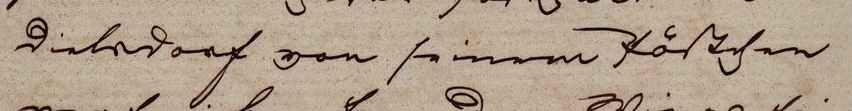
Dielsdorf von seinem Pöstchen
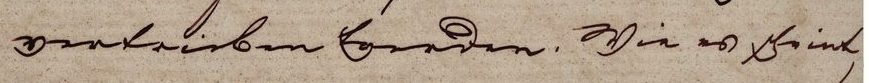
vertrieben werden. Wie es scheint,
